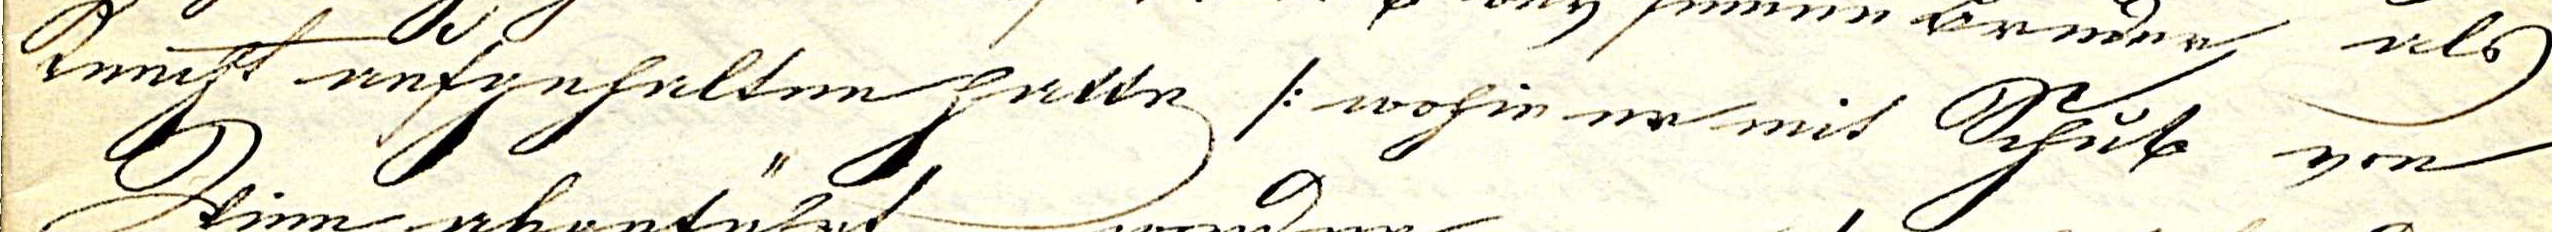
Knecht aufgehalten hatte (wohin er mit Schub von
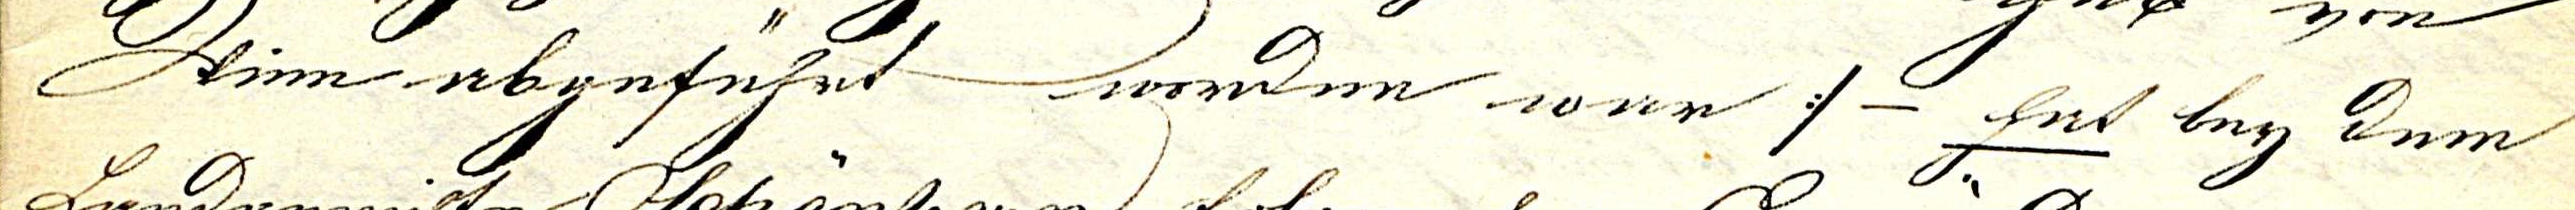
Wien abgeführt worden war) hat bey dem
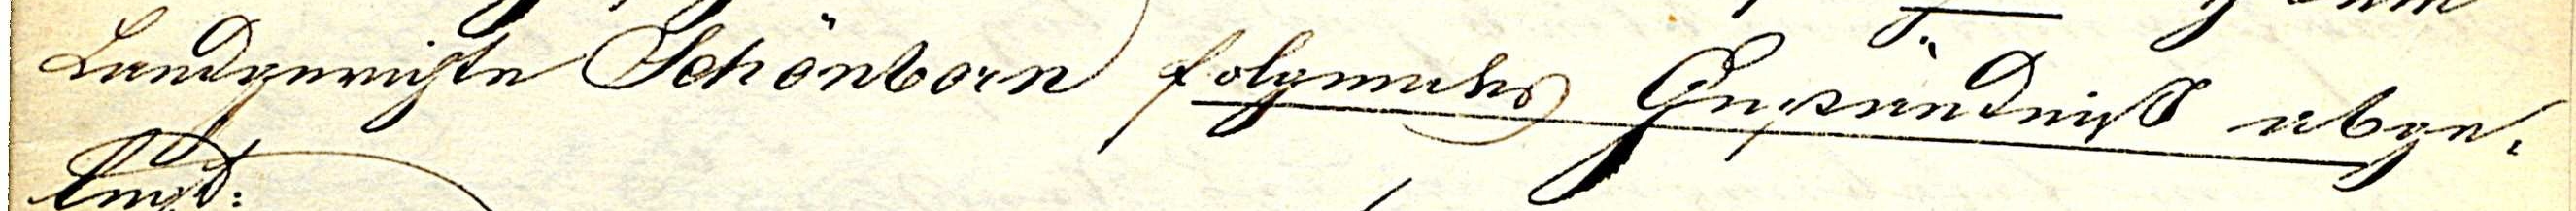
Landgerichte Schönborn folgendes Geständniß abge¬
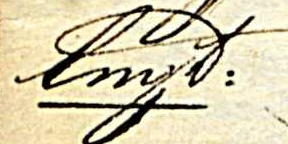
legt:
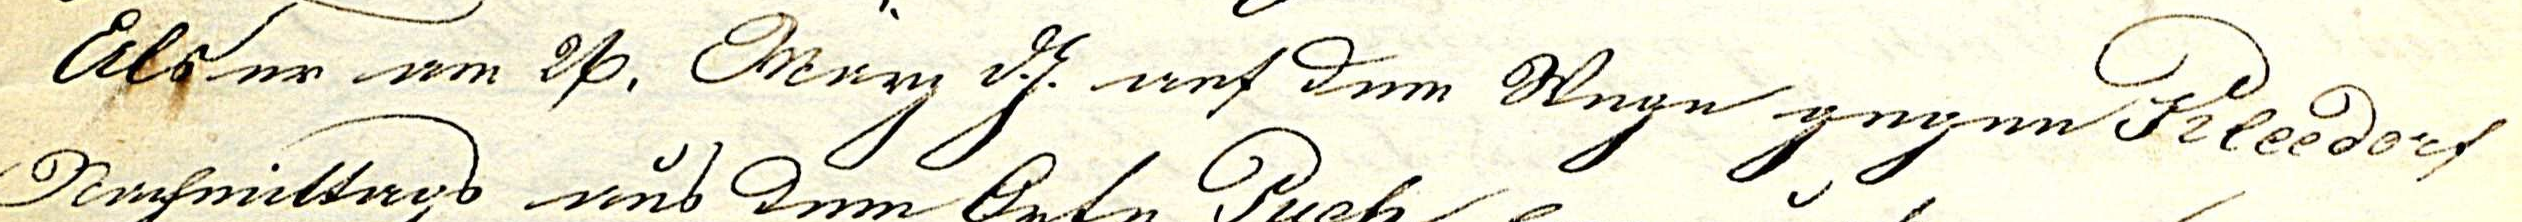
Als er am 26. März d.J. auf dem Wege gegen Kleedorf
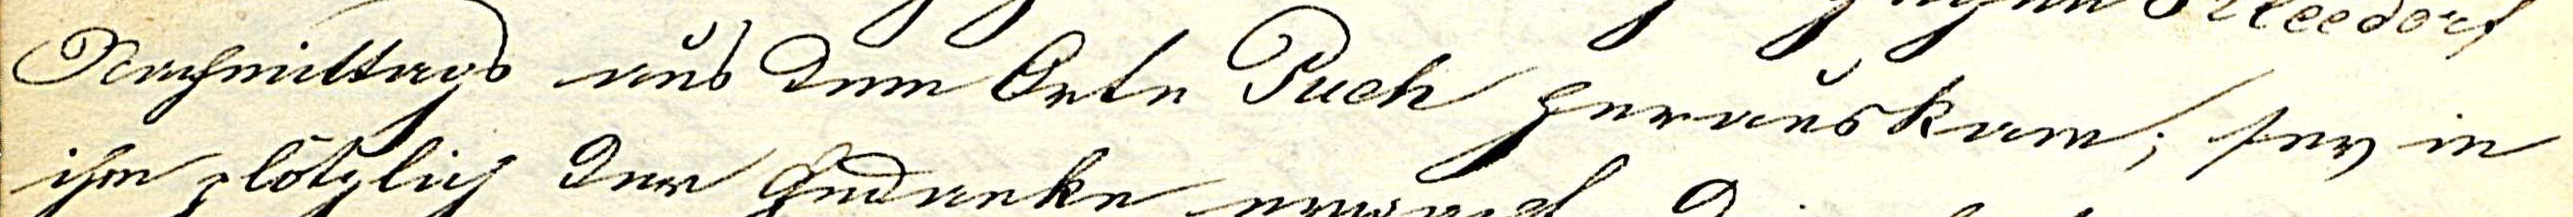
Nachmittags aus dem Orte Puch herauskam; sey in
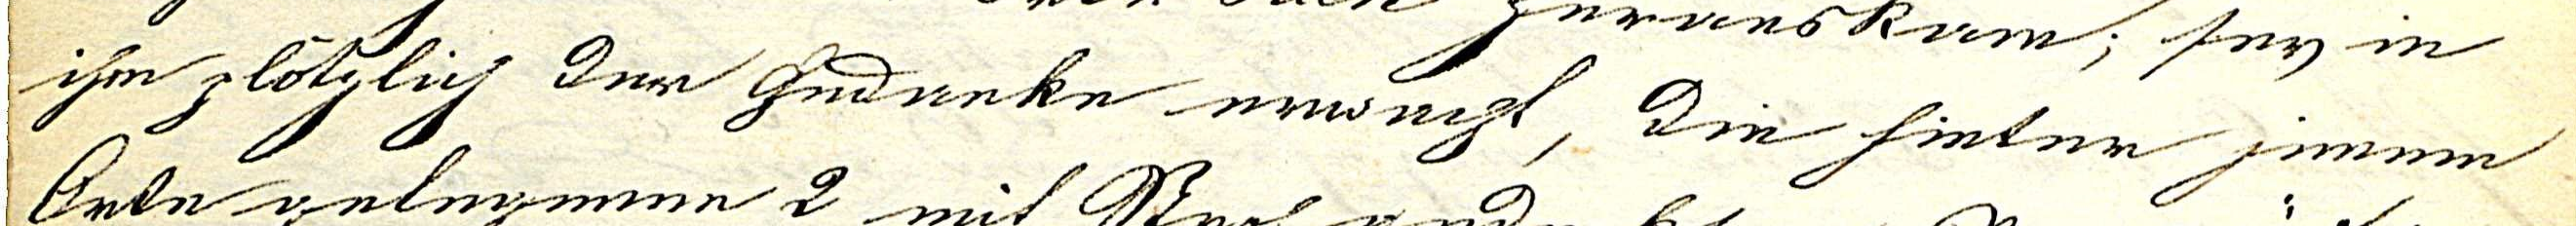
ihm plötzlich der Gedanke erwacht, die hinter jenem
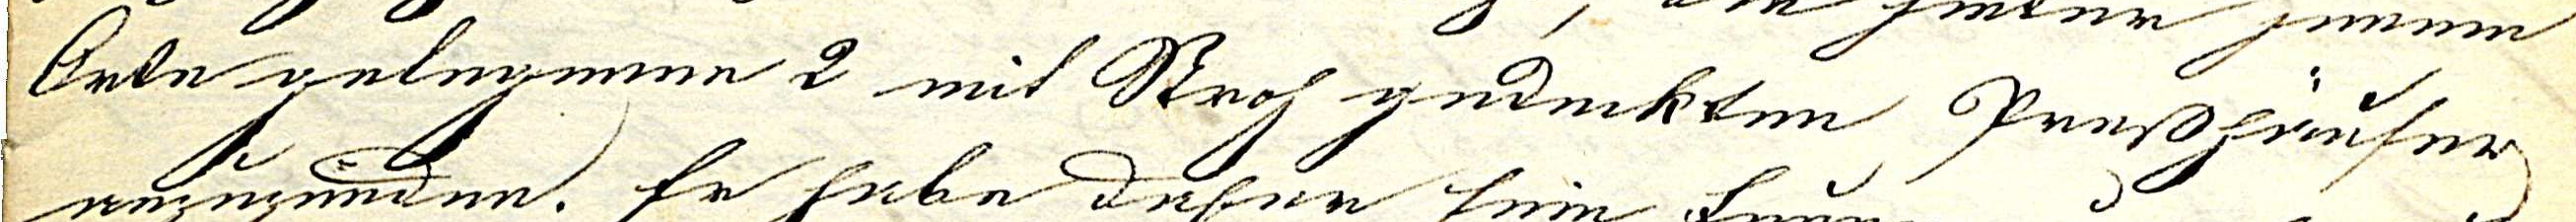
Orte gelegenen 2 mit Stroh gedeckten Preßhäuser
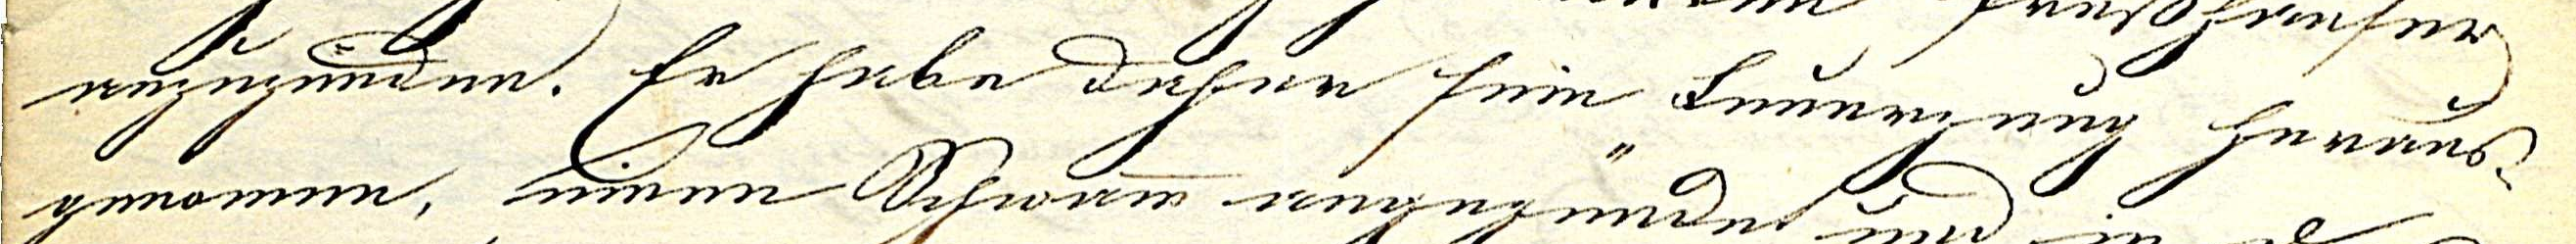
anzuzünden. Er habe daher sein Feuerzeug heraus¬
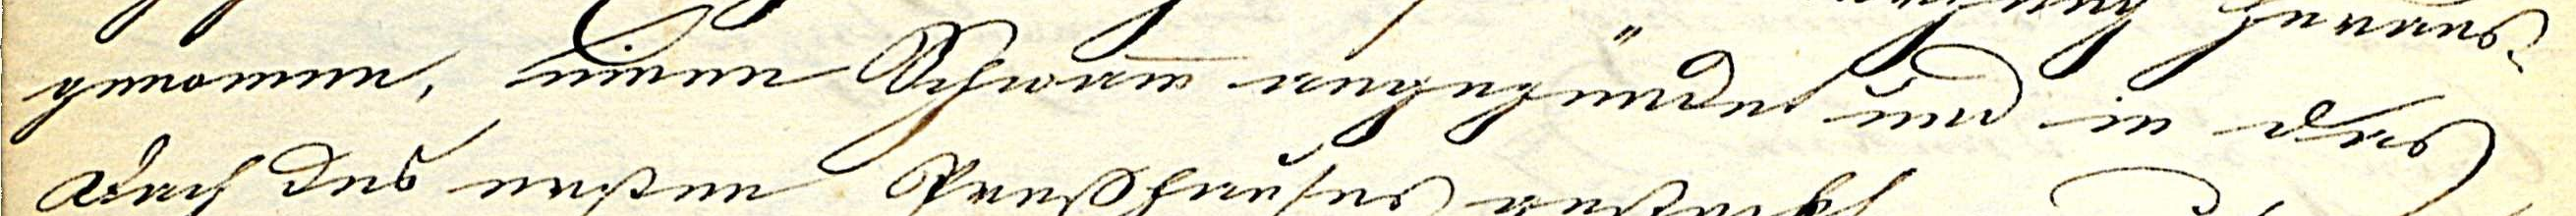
genommen, einen Schwamm angezündet und in das
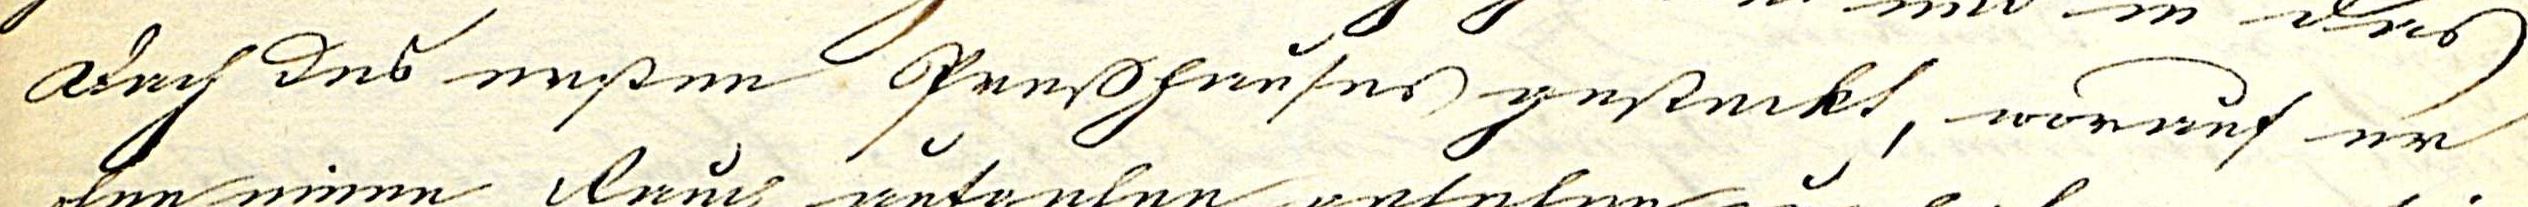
Dach des ersten Preßhauses gesteckt, worauf er
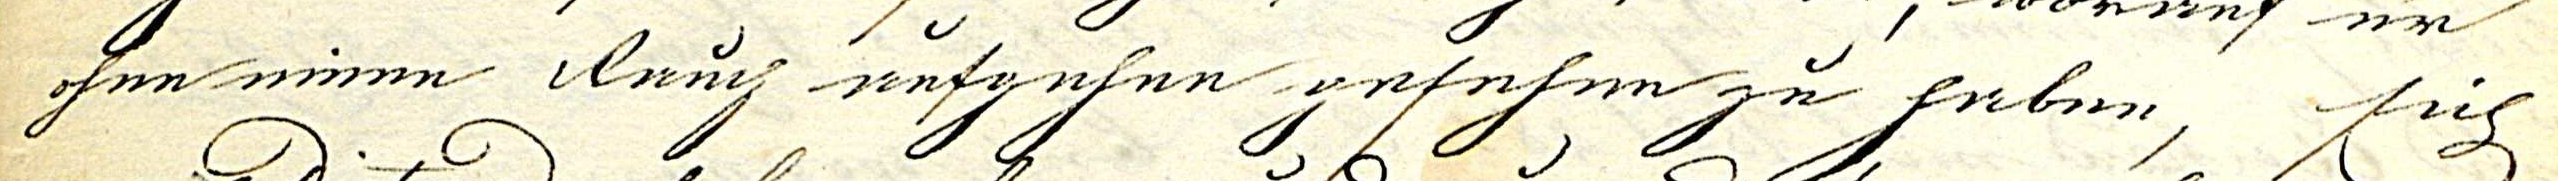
ohne einen Rauch aufgehen gesehen zu haben, sich
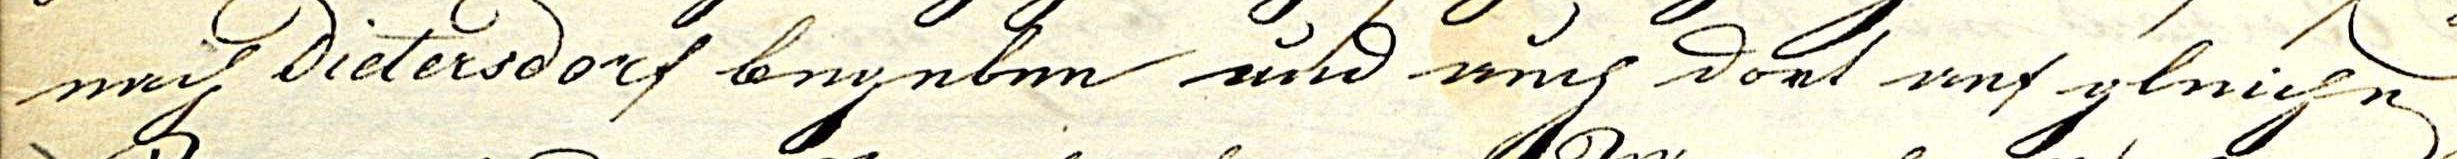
nach Dietersdorf begeben und auch dort auf gleiche
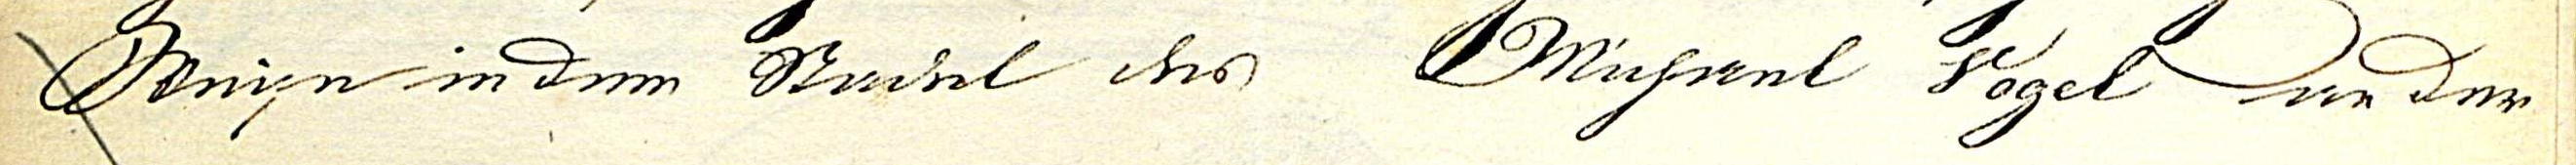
Weise in dem Stadel des Michael Vogel an der
